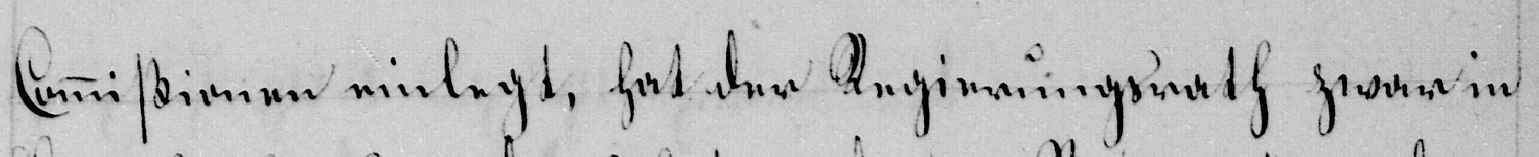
Commißionen einlegt, hat der Regierungsrath zwar in
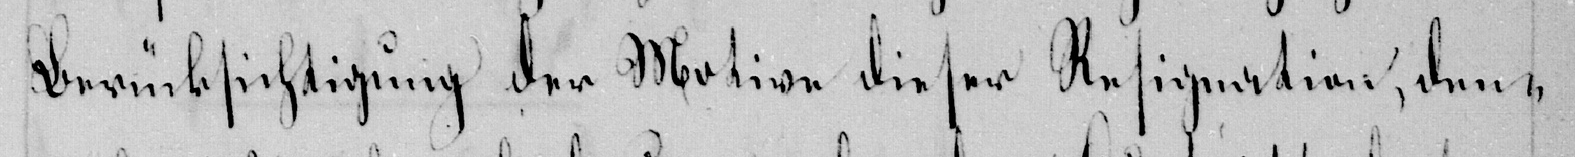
Berücksichtigung der Motive dieser Resignation, den¬
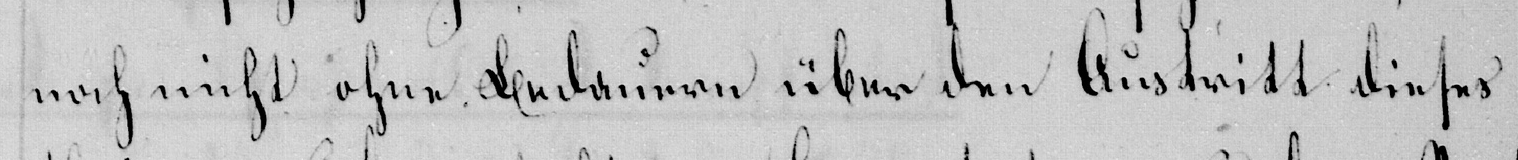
noch nicht ohne Bedauern über den Austritt dieses
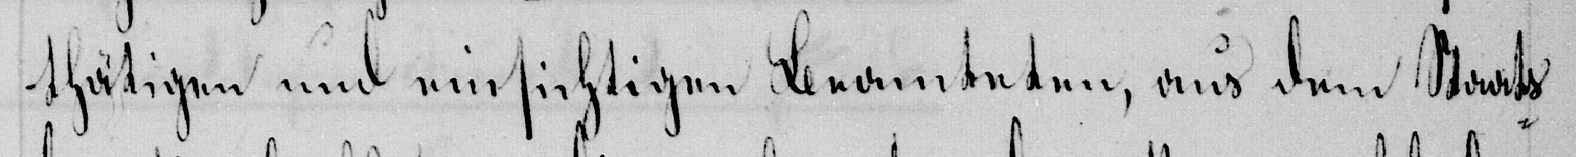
thätigen und einsichtigen Beamteten, aus dem Staats¬
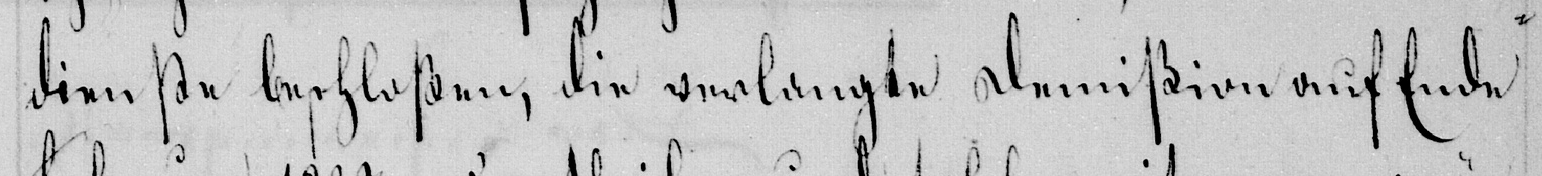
dienste beschloßen, die verlangte Demißion auf Ende
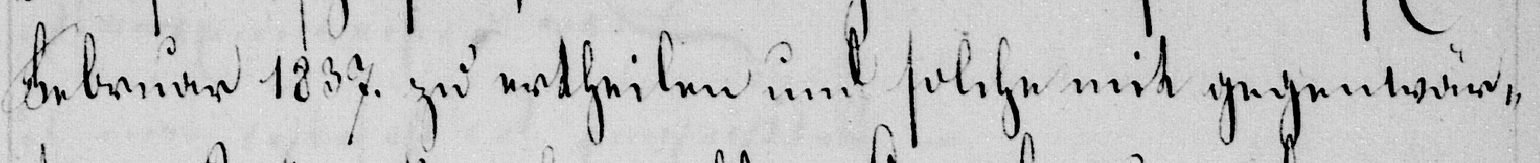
Februar 1837. zu ertheilen und solche mit gegenwär¬
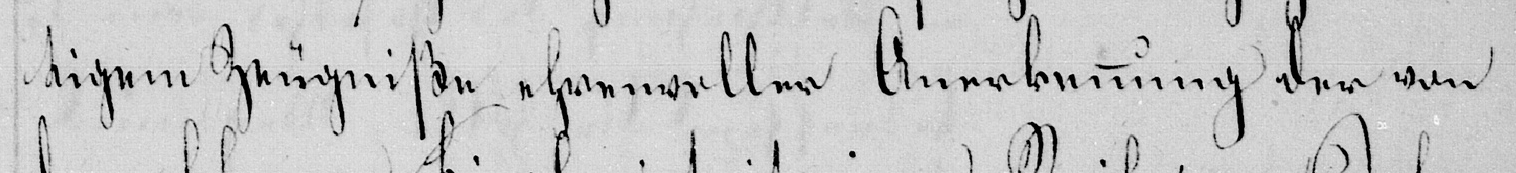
tigem Zeugniße ehrenvoller Anerkennung der von
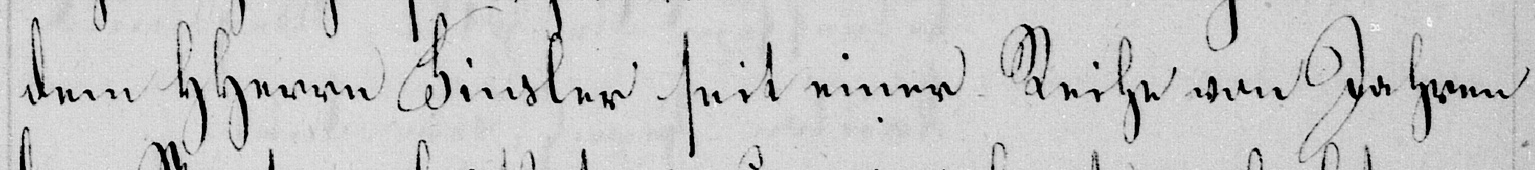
dem HHerrn Finsler seit einer Reihe von Jahren
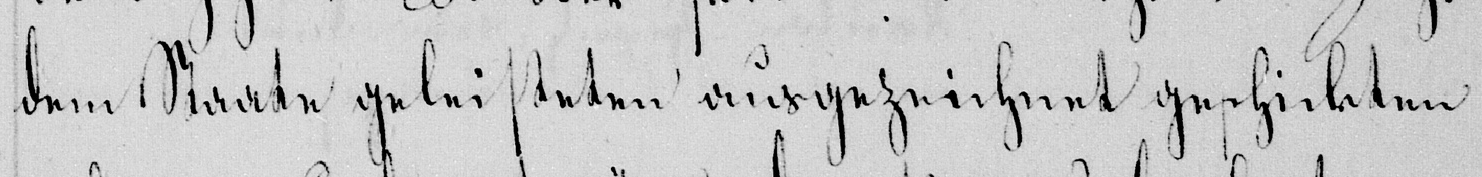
dem Staate geleisteten ausgezeichnet geschickten
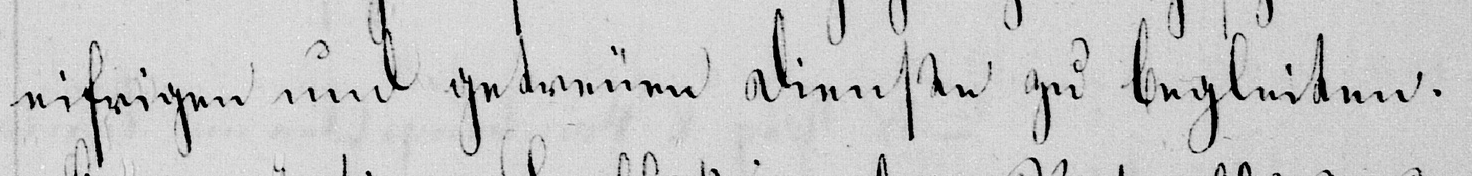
eifrigen und getreuen Dienste zu begleiten.
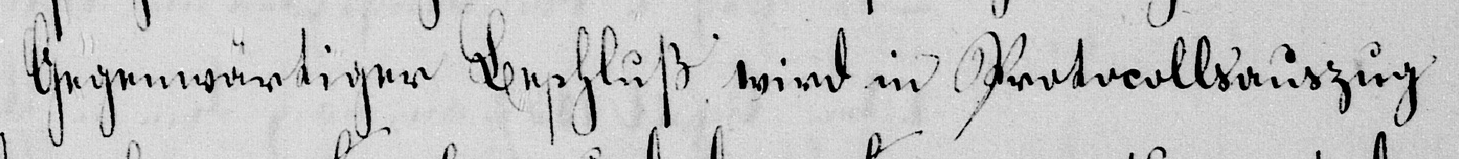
Gegenwärtiger Beschluß wird in Protokollsauszug
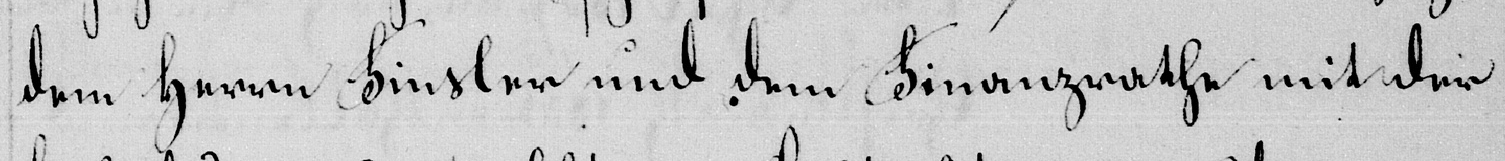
dem Herrn Finsler und dem Finanzrathe mit der
